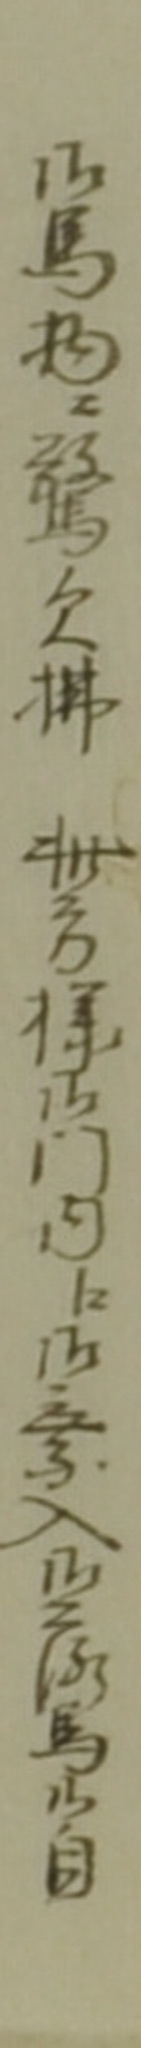御馬物ニ驚欠払此方様御門内江御乗入御落馬御自
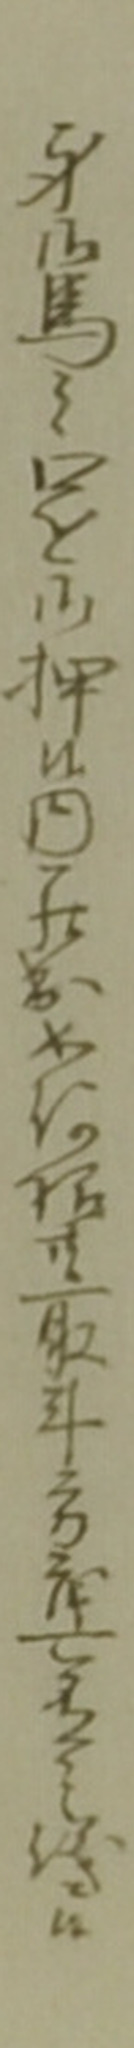身御馬之口を押候内罷出如何様共取計方茂可有之儀ニ候
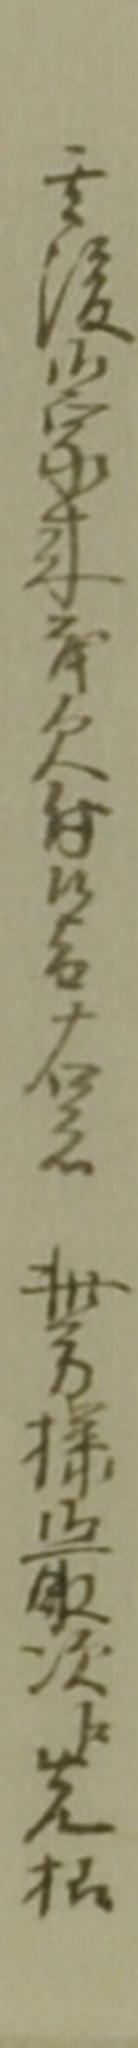其後御家来茂欠付候旨右者此方様御取次江先様
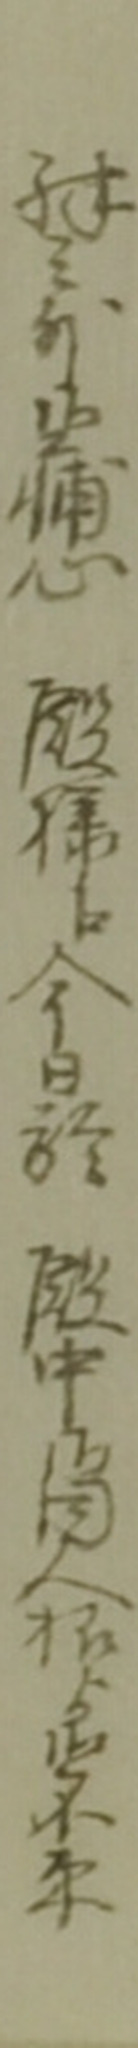殊之外御痛心殿様江今日於殿中御同人様ゟ御不束
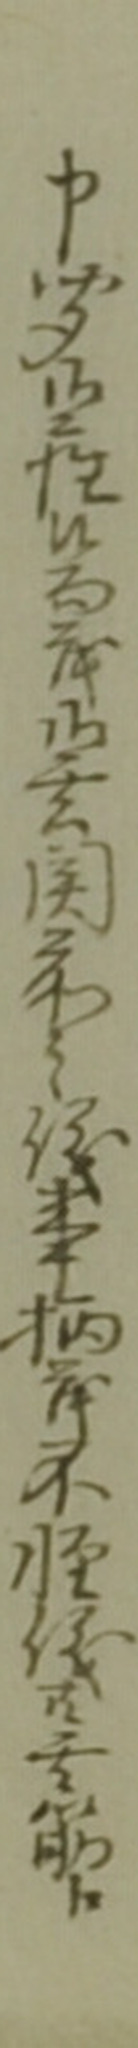申聞御座候而茂御玄関前之儀事柄茂不軽儀共其筋江
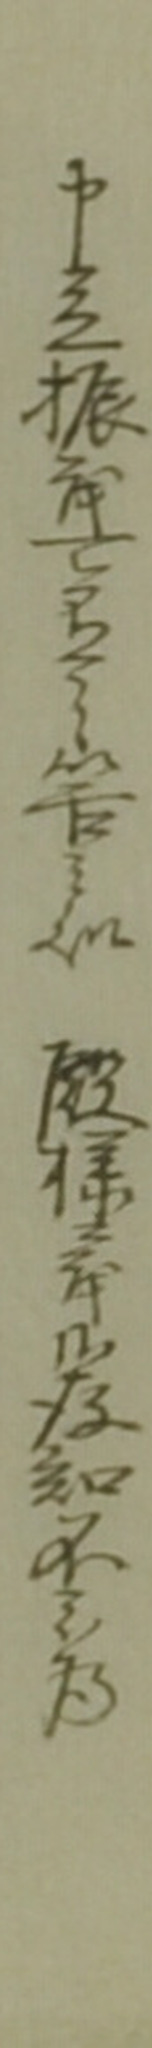申立振茂可有之筈之処殿様ニ茂御存知不被為
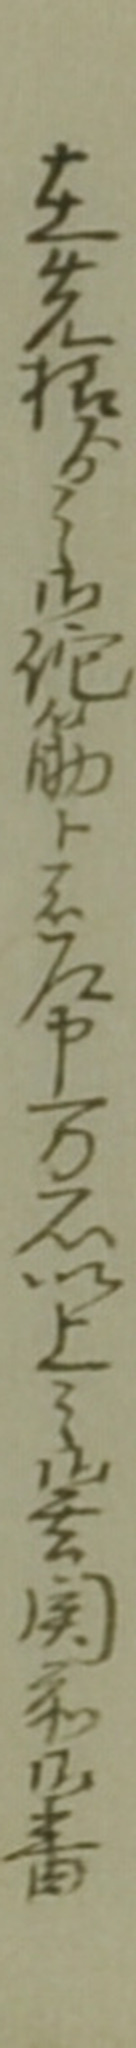在先様ゟ之御詫筋ト者乍申万石以上之御玄関前御番
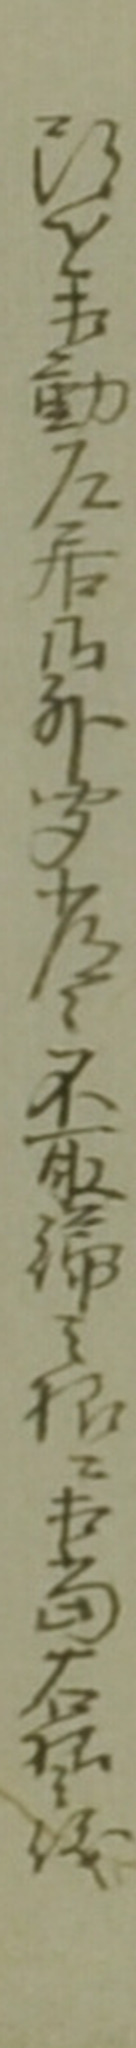頭を相勤乍居御外聞常々不取締之様ニ相当右様之儀
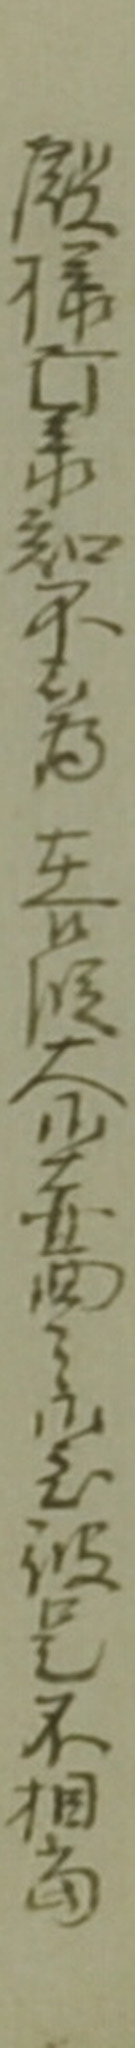殿様御承知不被為在候段大御赤面之御至彼是不相当
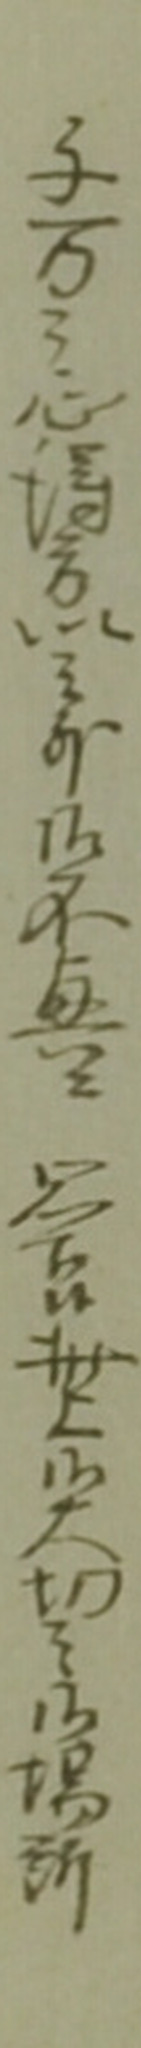千万之心得方以之外御不興ニ思召候此上御大切之御場所

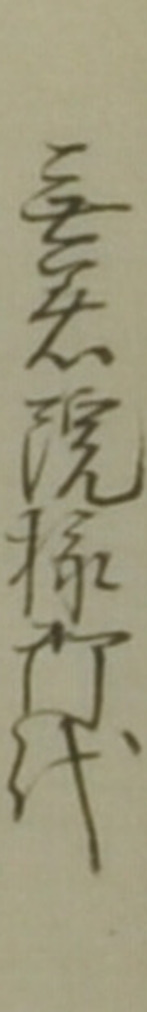無着院様御代
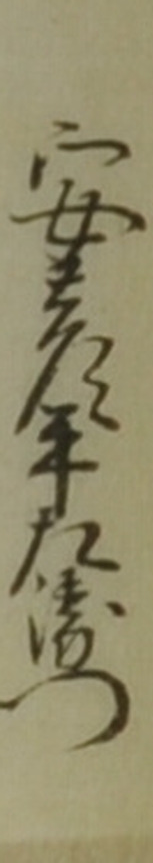安彦平左衛門
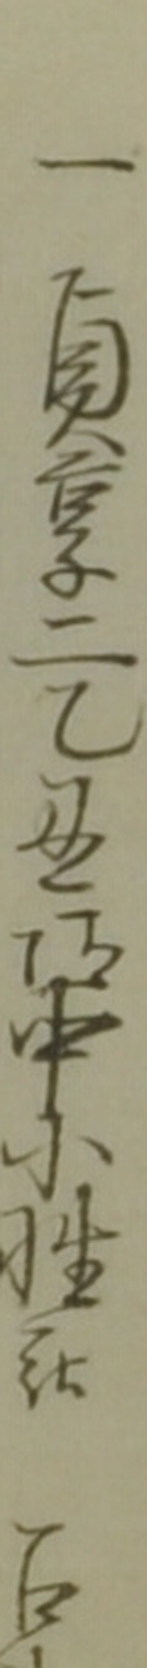一貞享二乙丑御中小性被召出
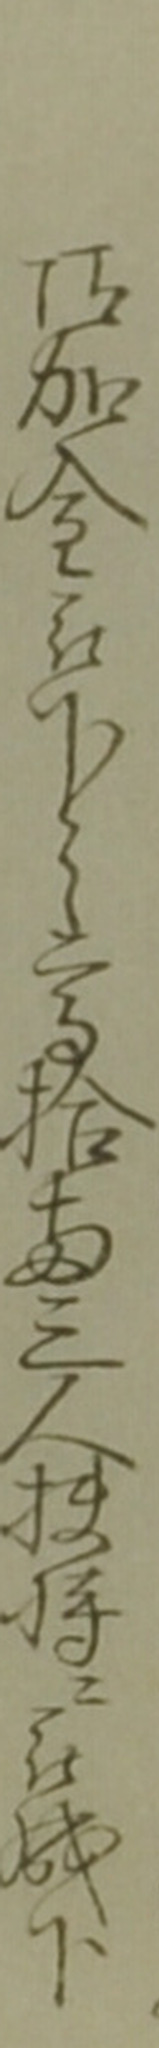御加金被下候高拾両三人扶持二被成下
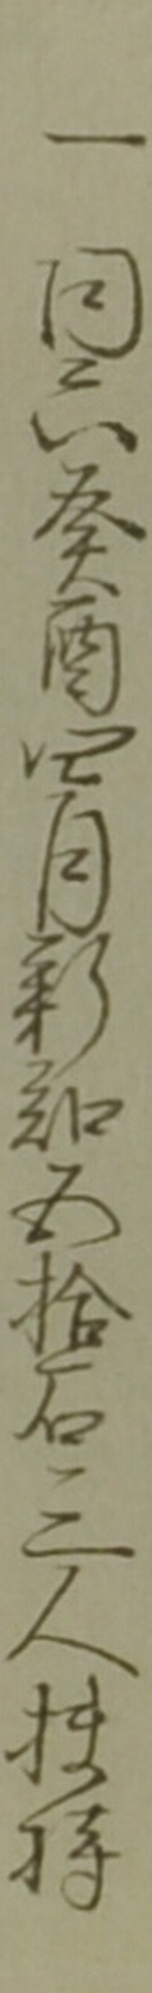一同六癸酉四月新知五拾石三人扶持
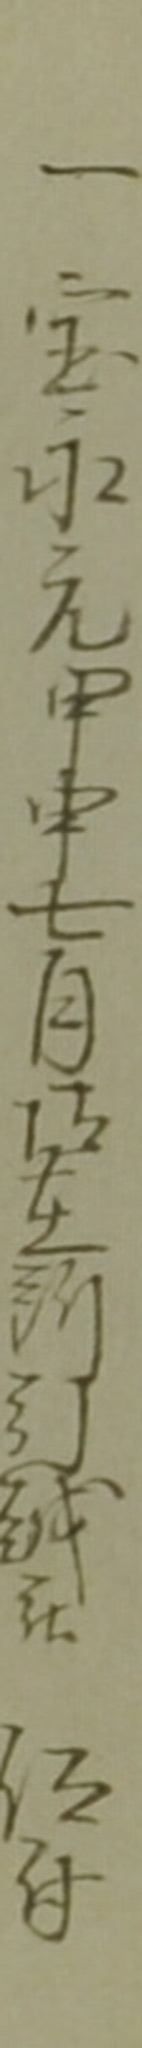一宝永元甲申七月御在所引越被仰付
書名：給人諸士勤仕録（三）
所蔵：伊那市立高遠町図書館・合同会社AMANE
